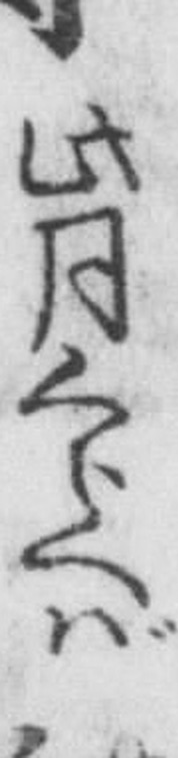此月くらへバ
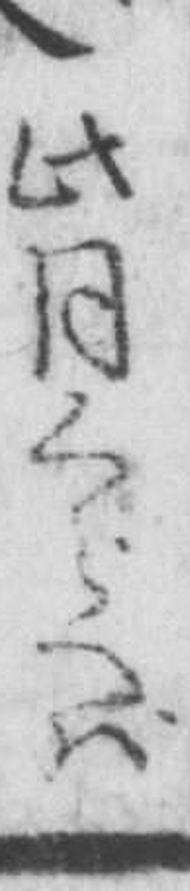此月くらへバ
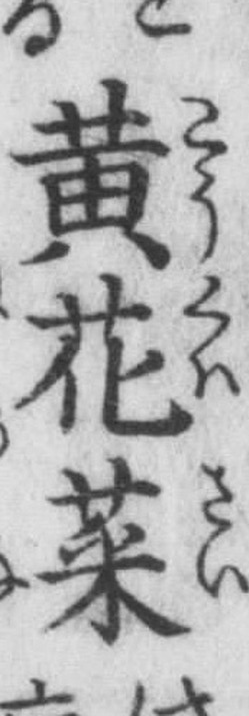黄花菜
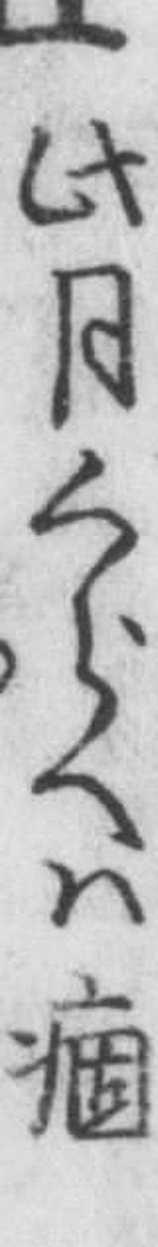此月くらへバ
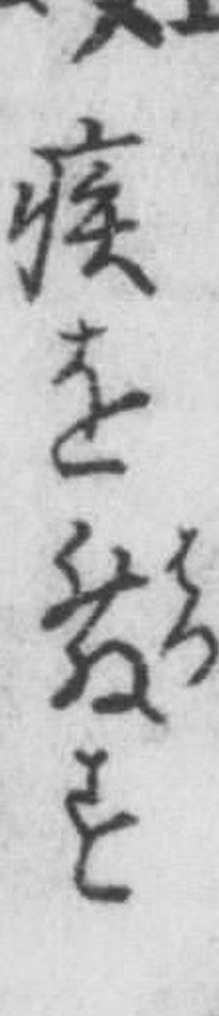疾を発す
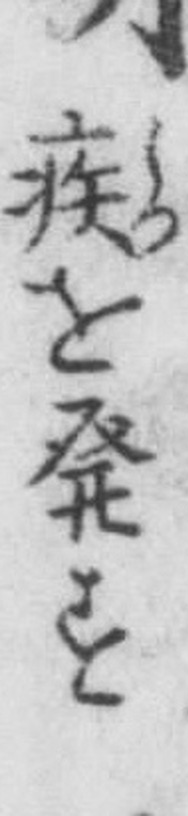疾を発す
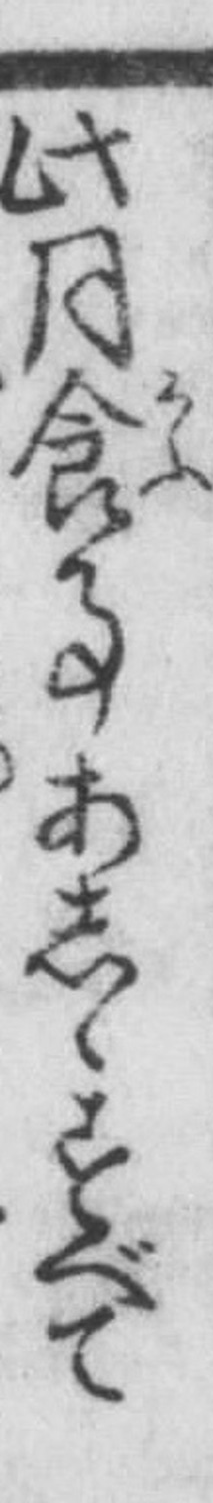此月食るあしすべて
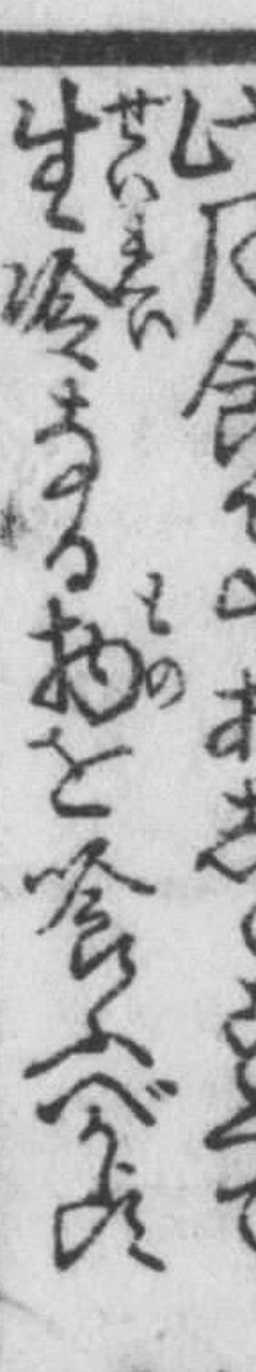生冷たる物を食ふべからず
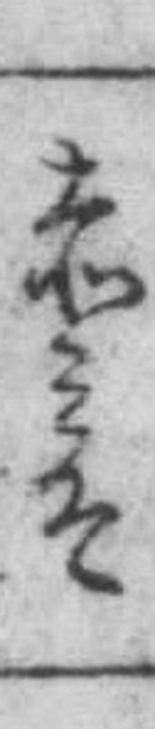赤ミそ

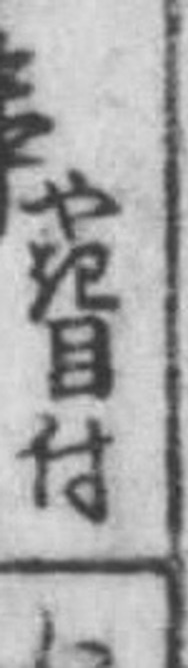やきめ目付
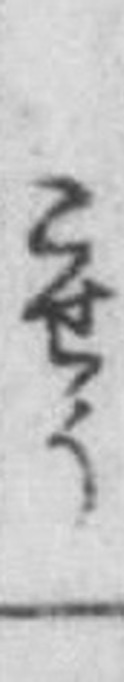こせう
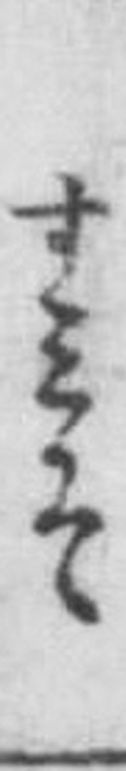すミそ
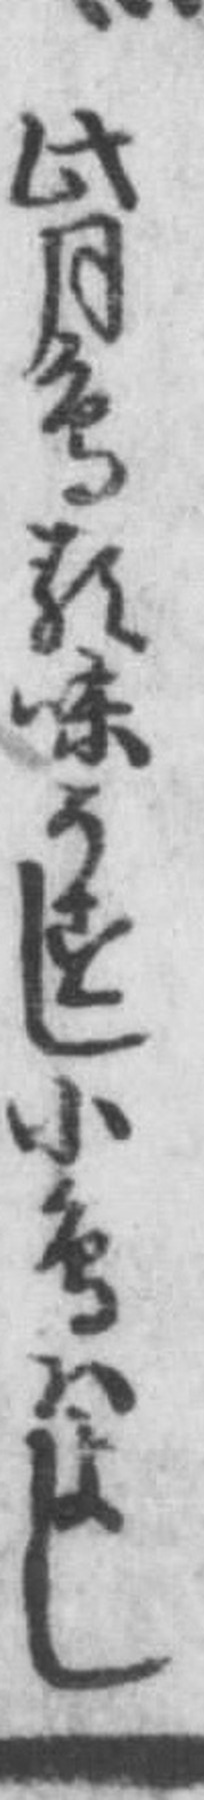此の月色数味うすし小鳥はよし
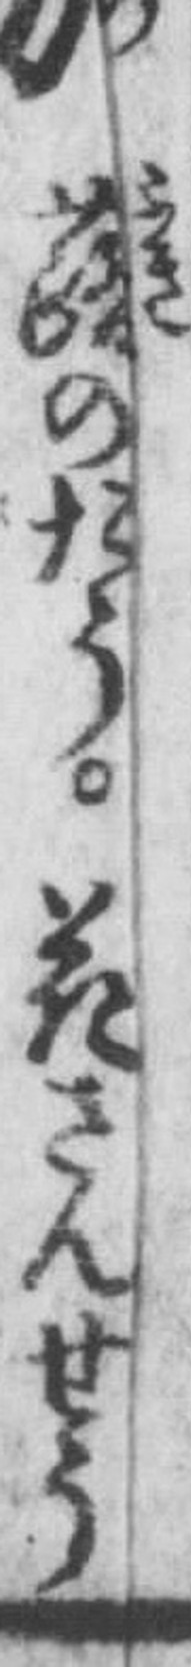蕗のたう花さんせう
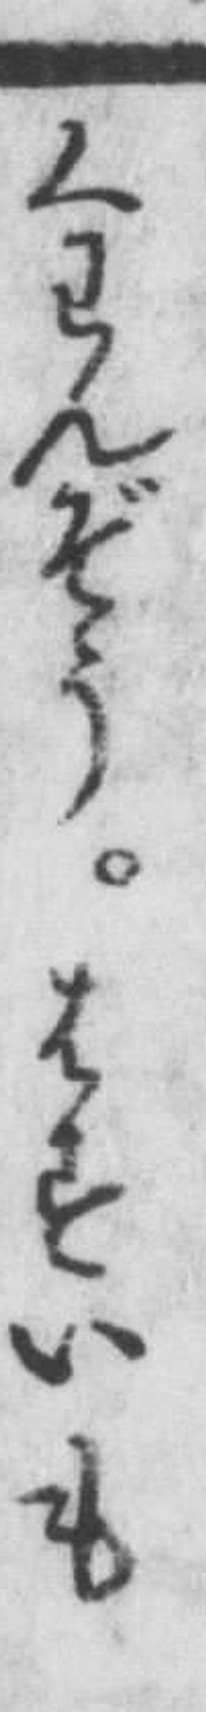くわんぞうはすいも
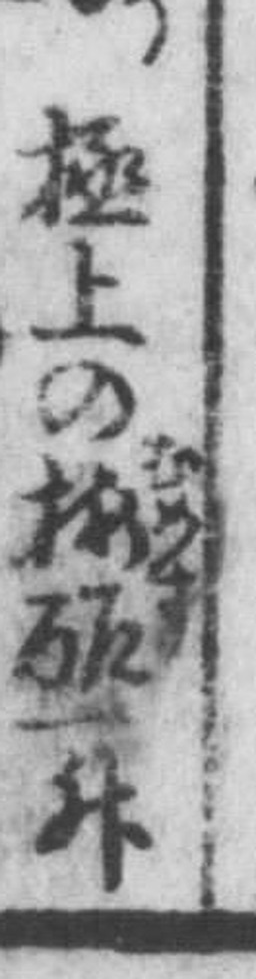極上の梅酢一升
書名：当世料理筌
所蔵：大阪府立大学学術情報センター 国文学研究資料館
